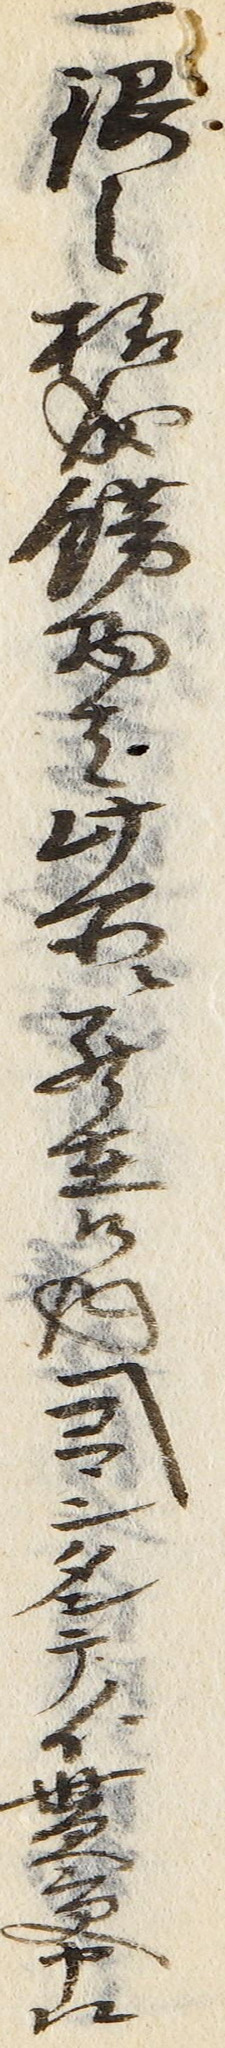一銀之様成餝物者此所ニ罷在候内「コマンタンテゟ貰受申候
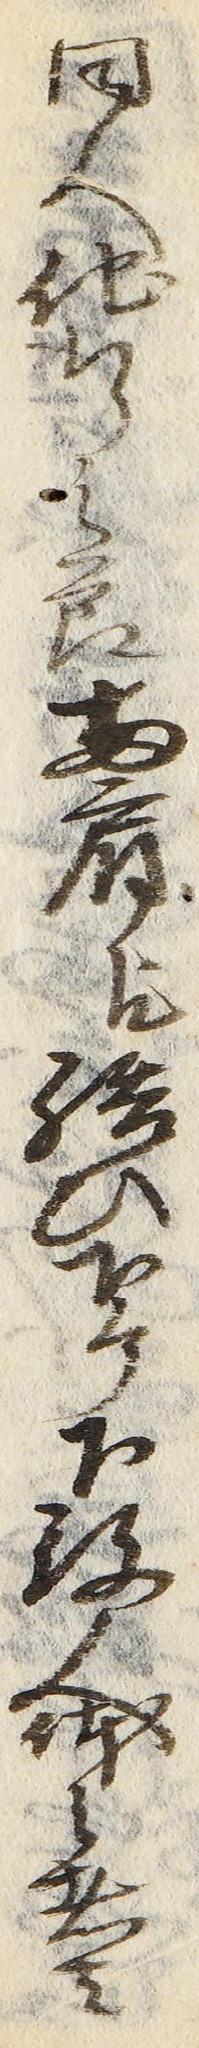同人他行之節両肩江結ひ下ケ下役人体之者は
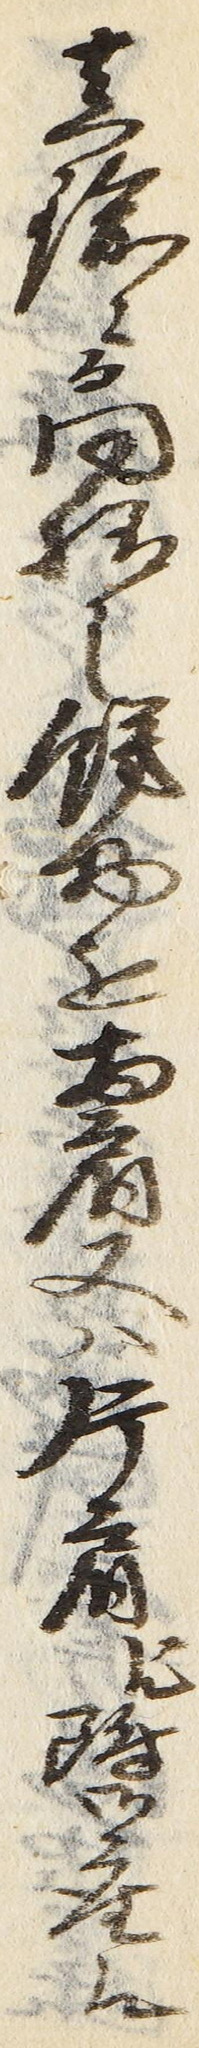真鍮ニ而同様之餝物を両肩又ハ片肩江附御座候
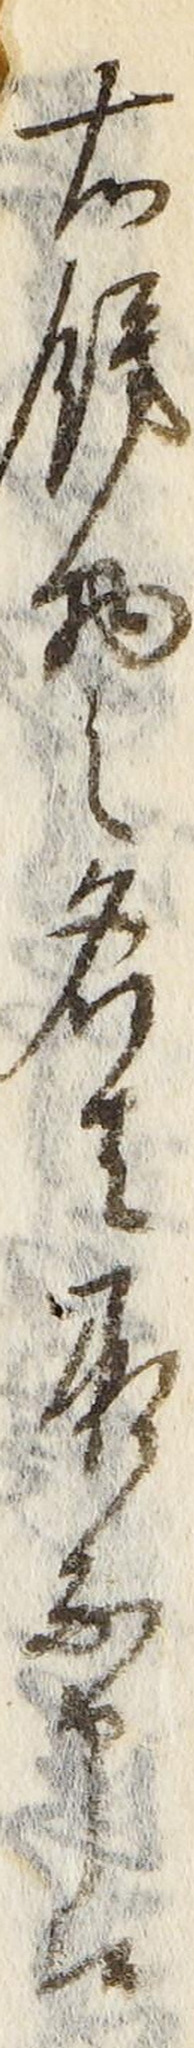右餝物之名者承不申候
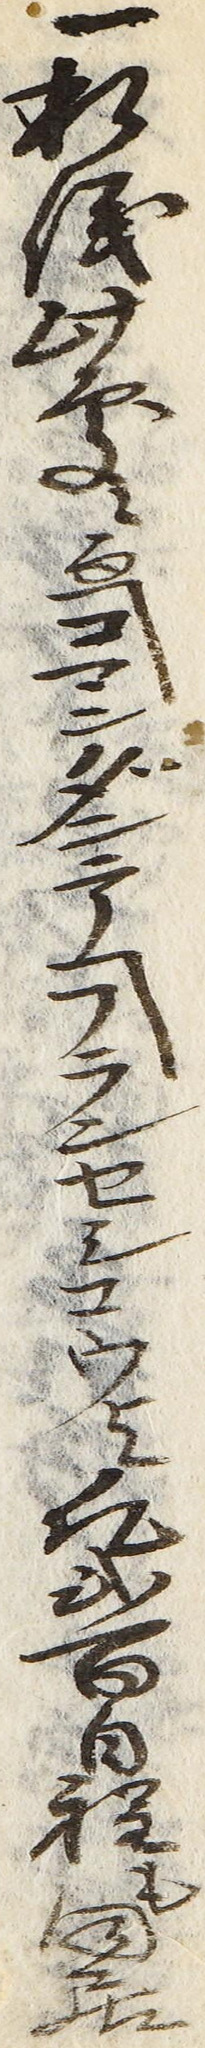一私儀此處ニ而「コマンダンテ「フランセシコウと凡弐百日程も同居
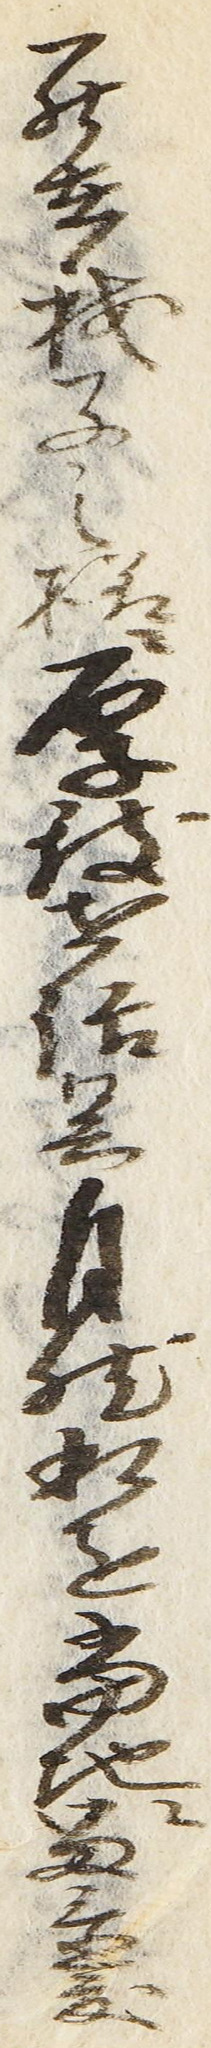罷在我子之様ニ厚致世話呉自然私を當地二留置度
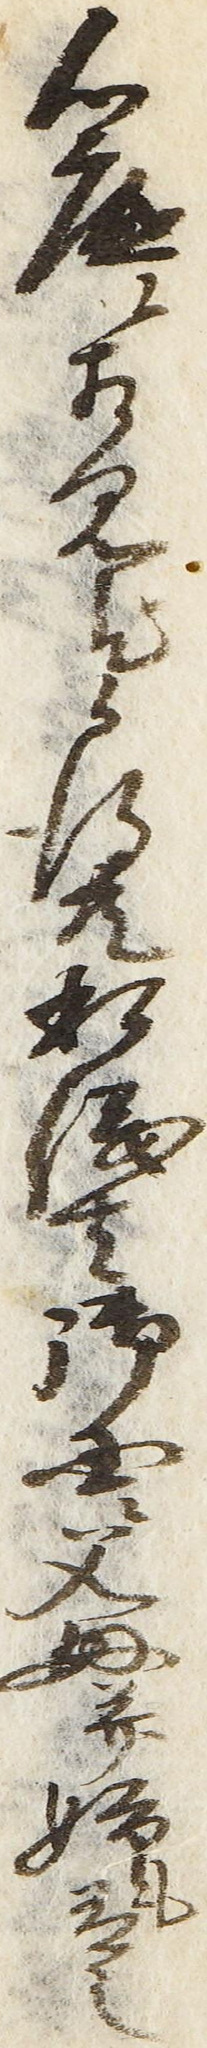心底ニ相見江候得共私儀者御国ニ父母幷姉も有之
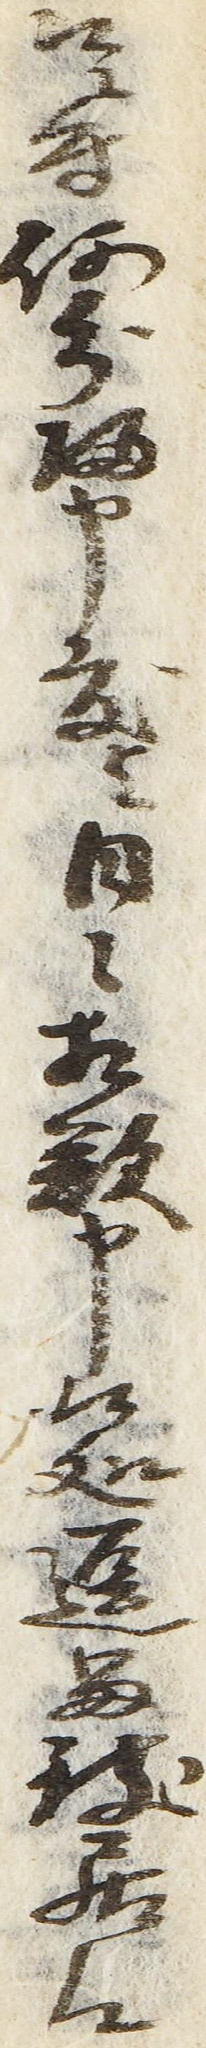候ニ付何分帰申度と日々相歎申候処逗留致居候
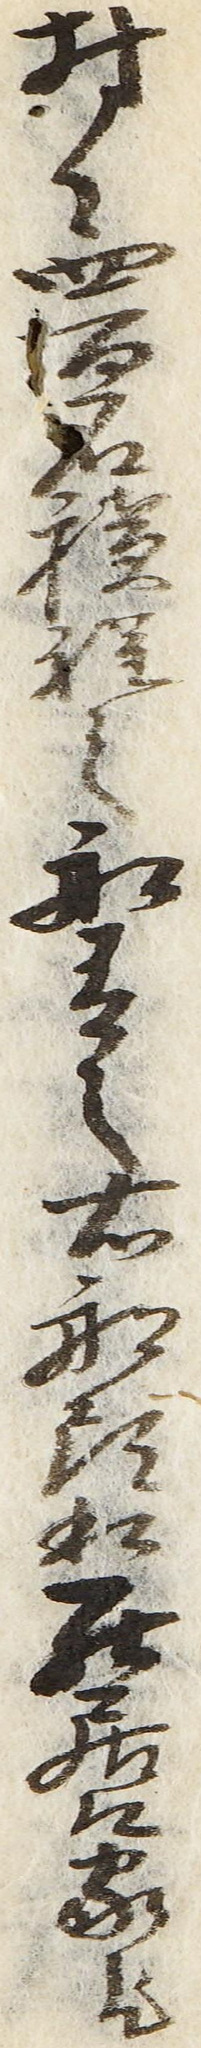村ニ四百石積程之舩有之右舩頭私罷居候家江
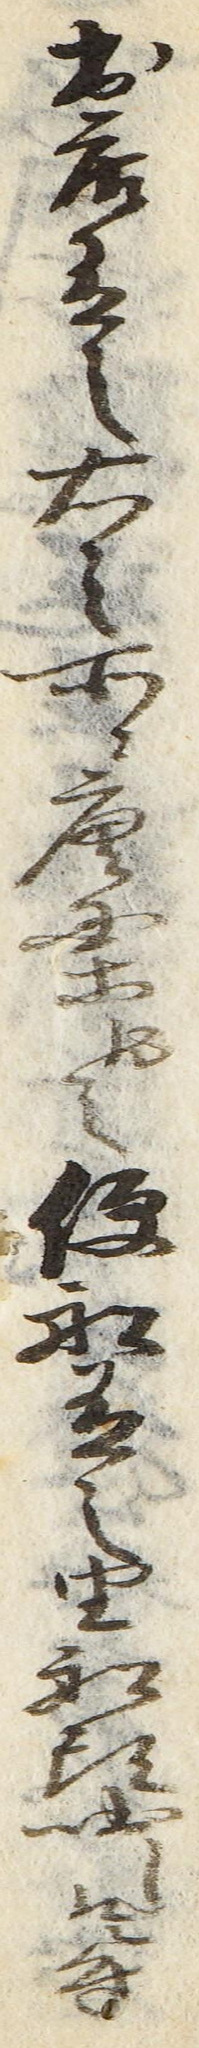出店有之右之所ニ唐国等江之便舩有之由舩頭咄し候ニ付

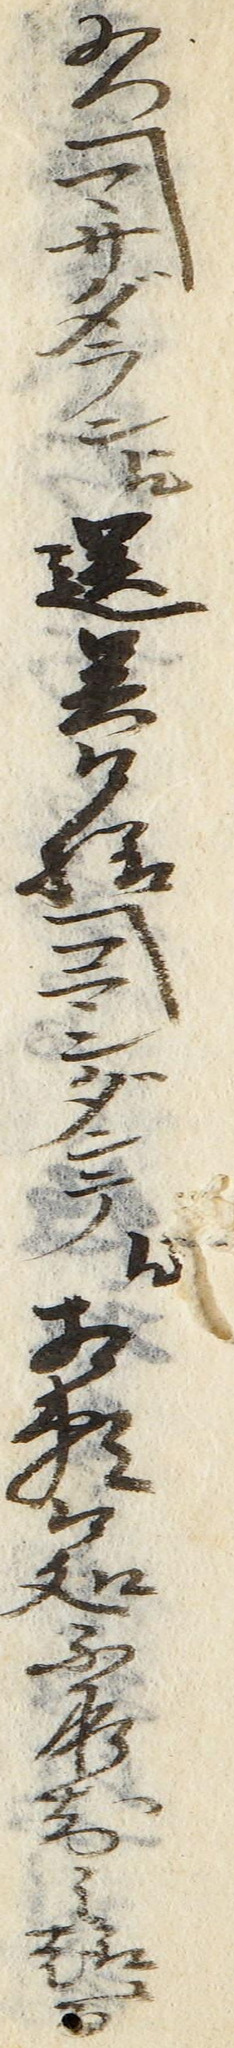右「マサダラン江送呉候様「コマンダンテ江相願候処不承知之趣ニ而
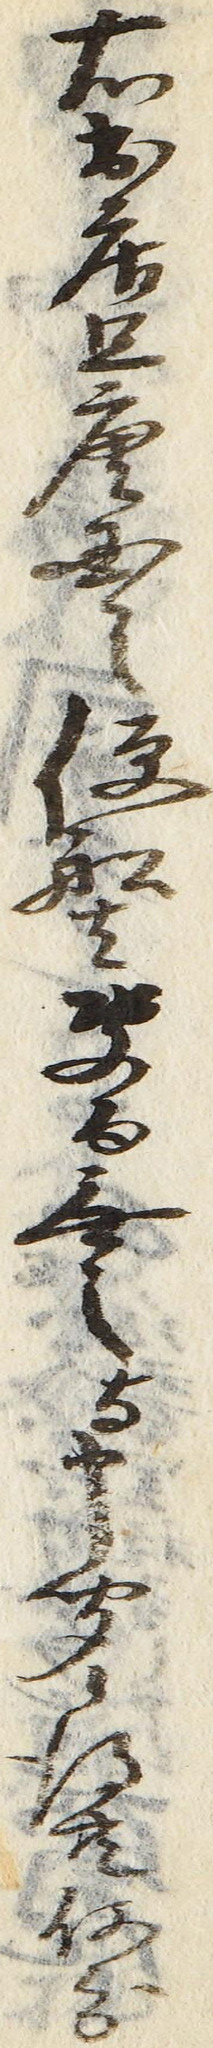右出居且唐国之便舩者決而無之と申聞候得共何分
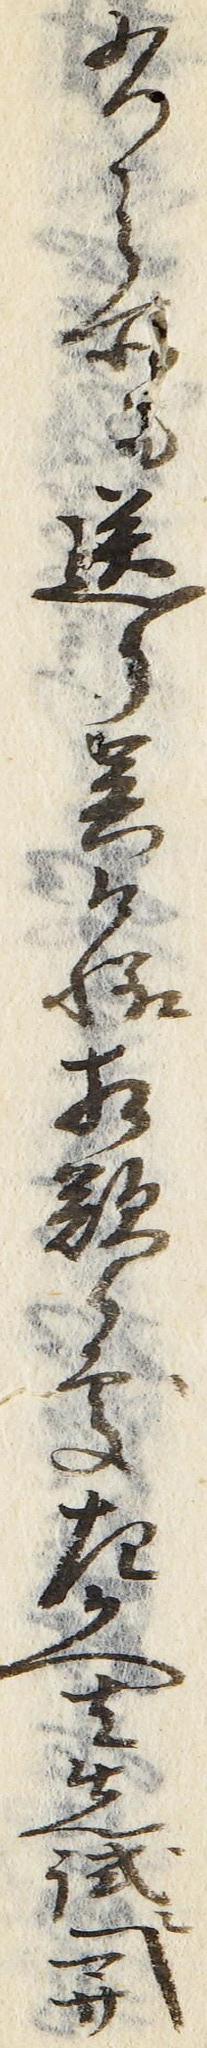右之所も送り呉候様相歎候處左候へ者試ニ「マサ
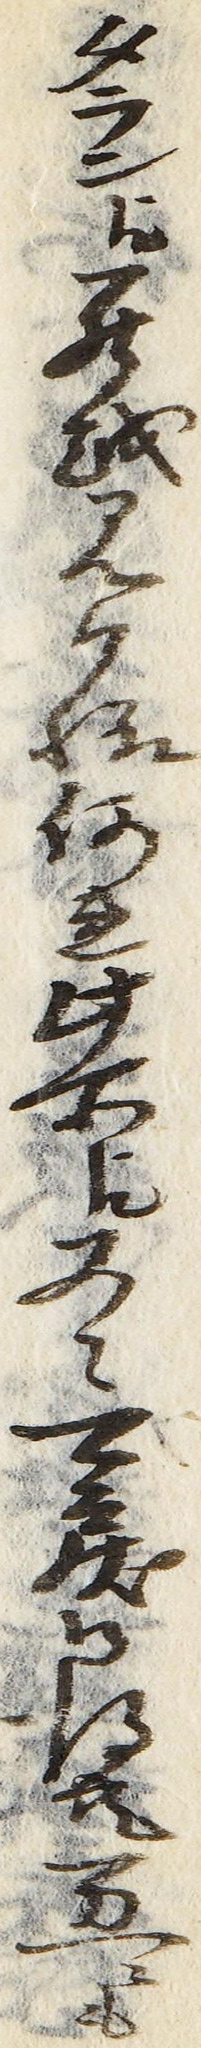タラン江罷越見ケ様何れ此所江又々可戻候得共万一ニも
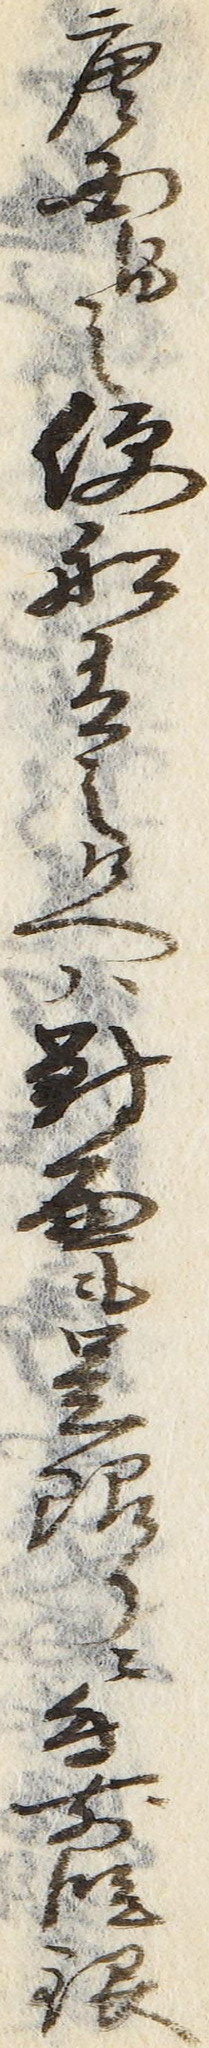唐国江之便舩有之候へハ對面も是限りニ付前段銀
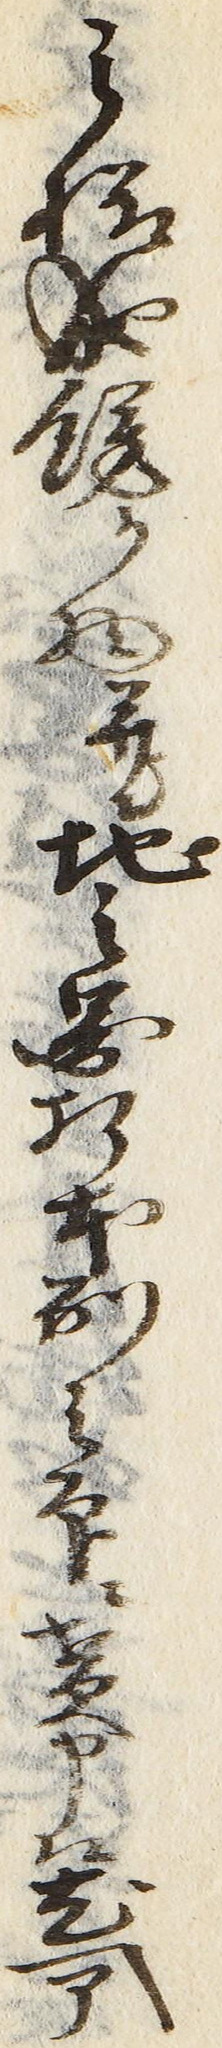之様成餝り物幷ニ地之圖折本別之印ニ貰申候尤「ア
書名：漂流人善助聞書
